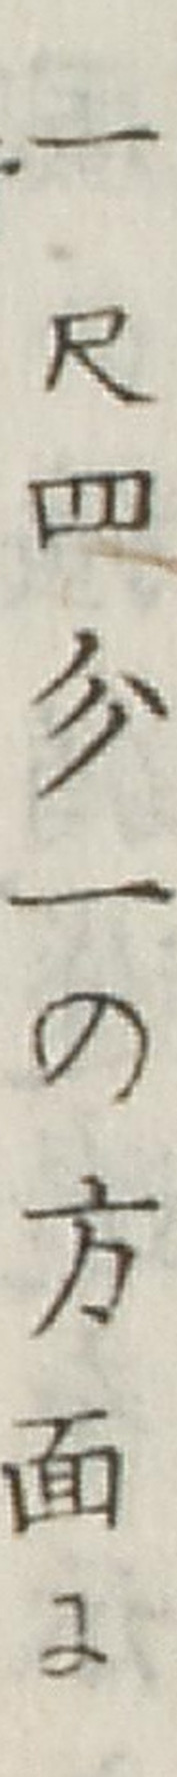一尺四分一の方面に
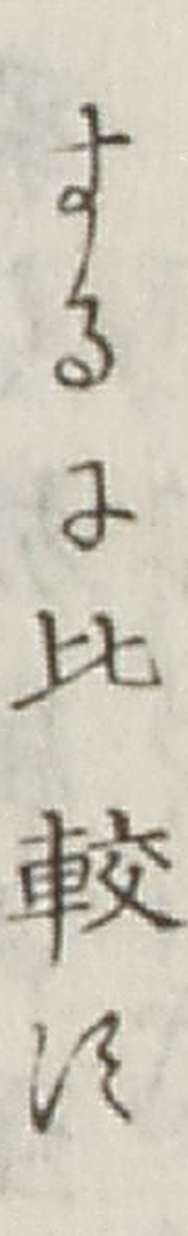するに比較す
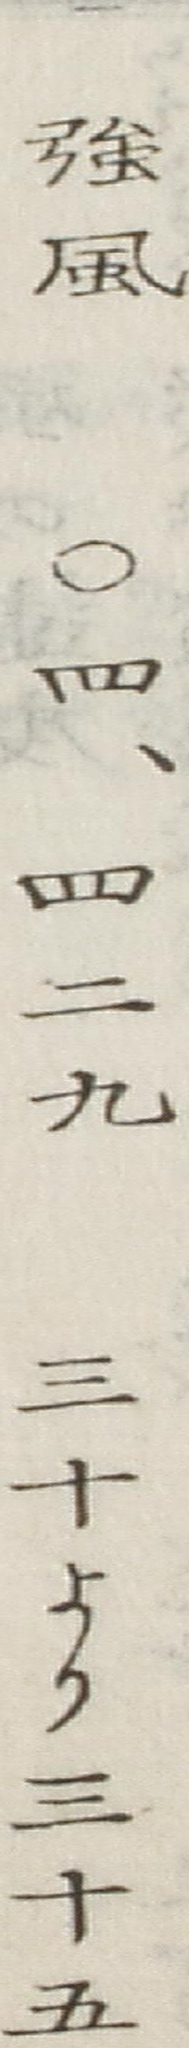強風〇四、四二九三十より三十五
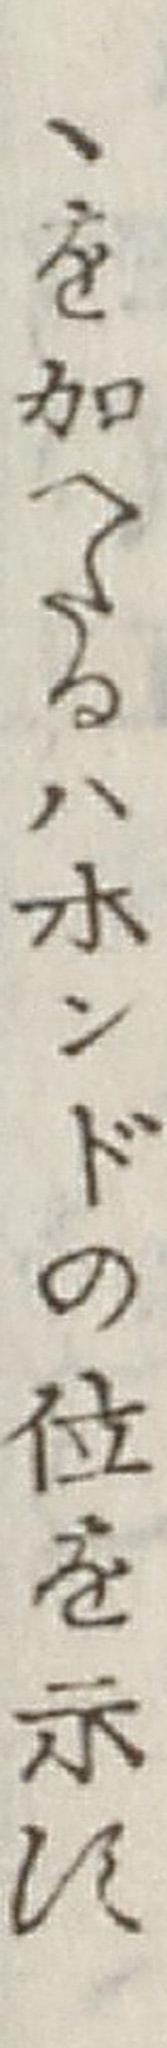、を加へたるはホンドの位を示す
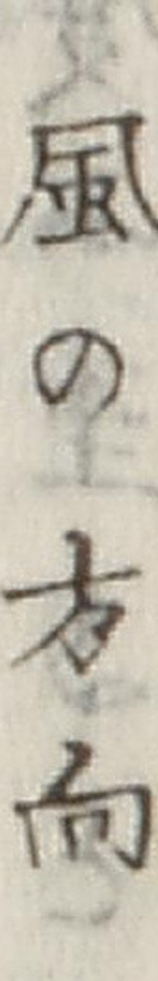風の方向
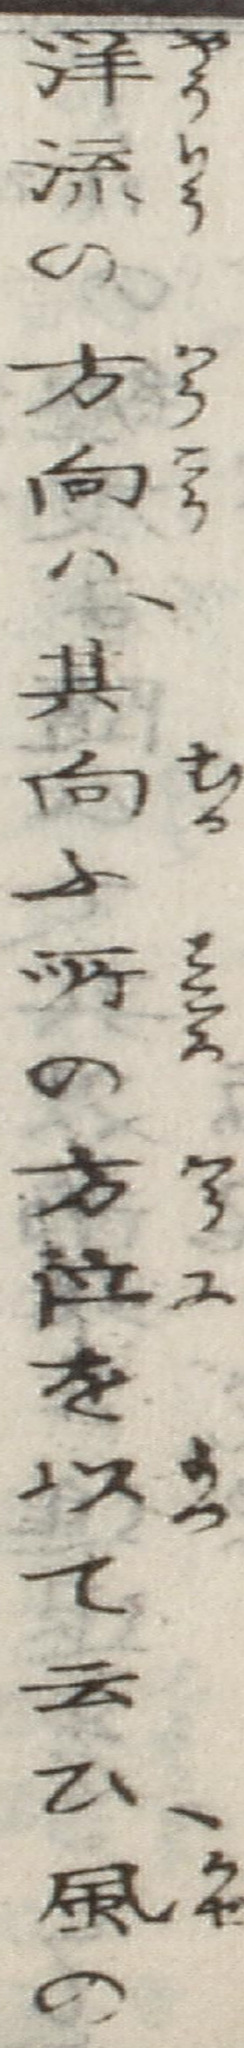洋流の方向は、其向ふ所の方位を以て云ひ、風の
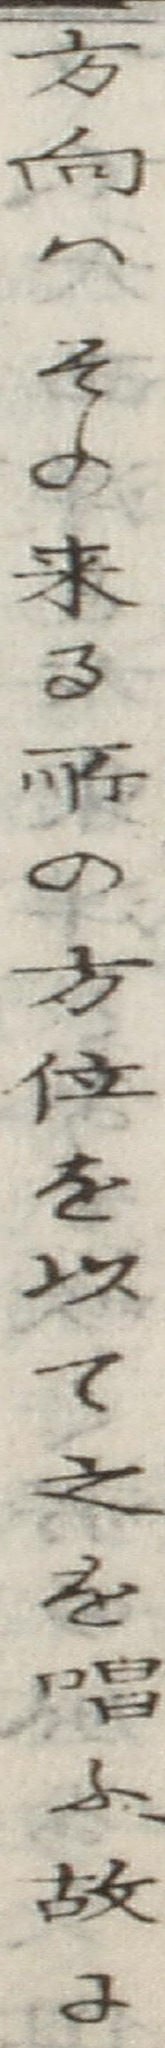方向はその来る所の方位を以て之を唱ふ、故に
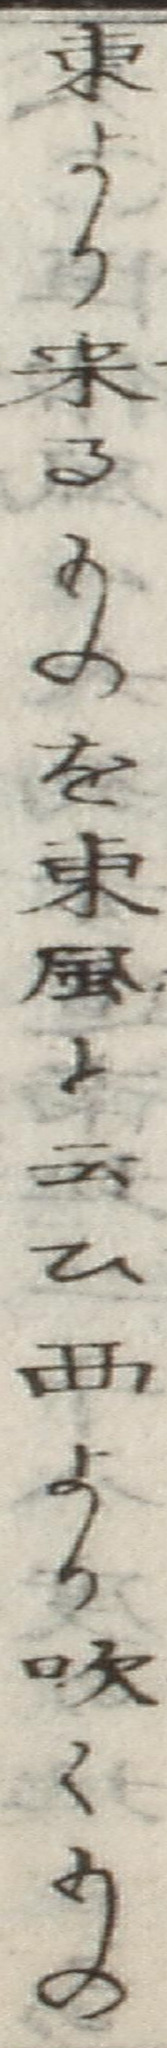東より来るものを東風と云ひ、西より吹くもの
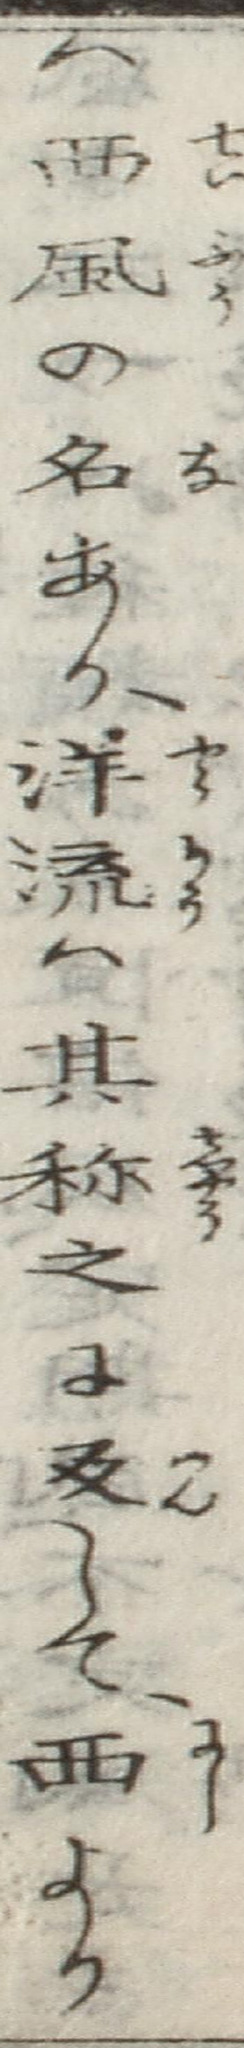は西風の名あり、洋流は其称之に反して、西より
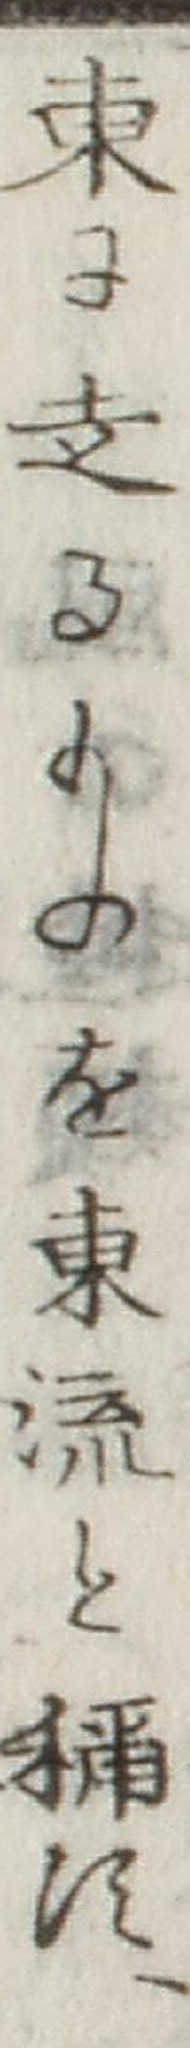東に走るものを東流と称す、
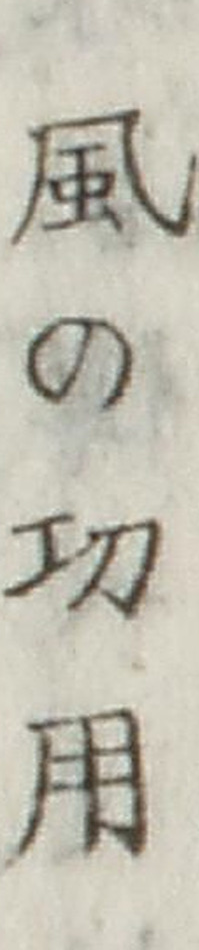風の功用
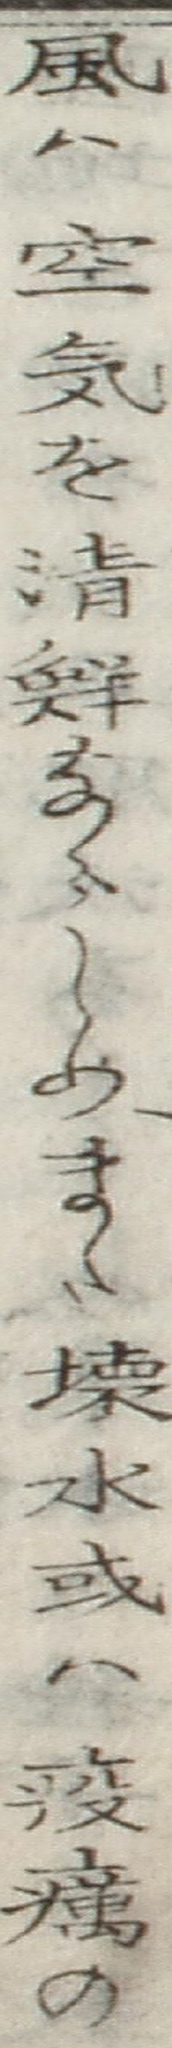風は空気を清鮮ならしめ、また壊水或は疫癘の
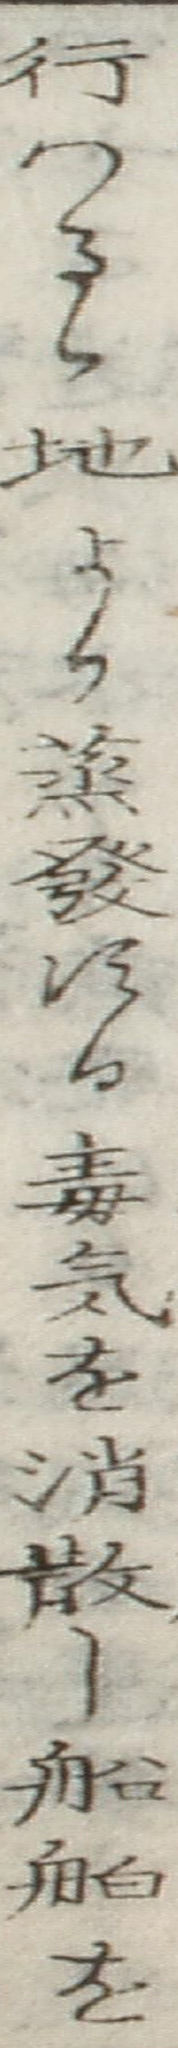行はるゝ地より蒸発する毒気を消散し船舶を

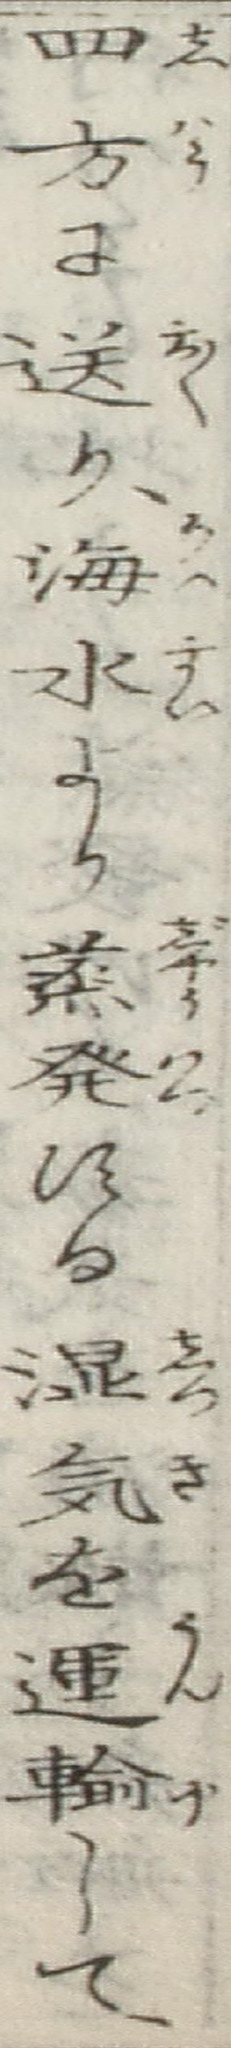四方に送り海水より蒸発する湿気を運輸して、
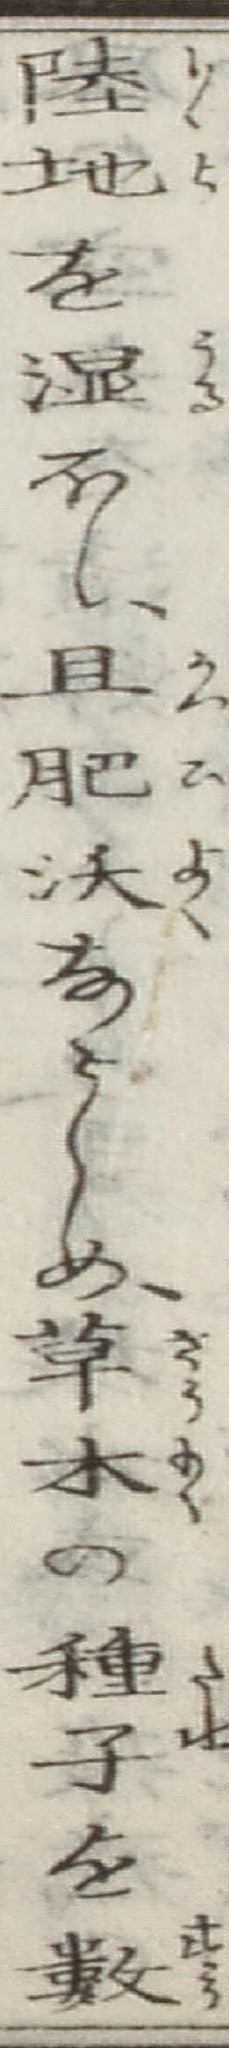陸地を湿ほし、且肥沃ならしめ、草木の種子を数
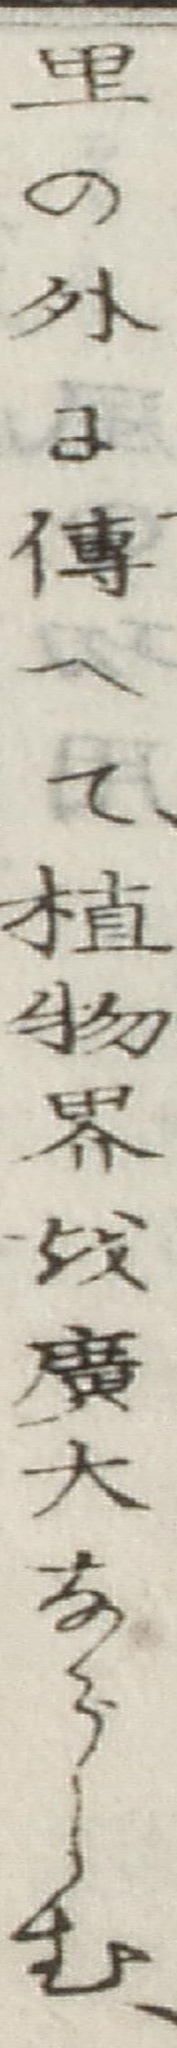里の外に傳へて、植物界を広大ならしむ、
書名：訓蒙　天然地理學　中
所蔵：東京大学地震研究所図書室 Earthquake Research Institute Library, The University of Tokyo, JAPAN
